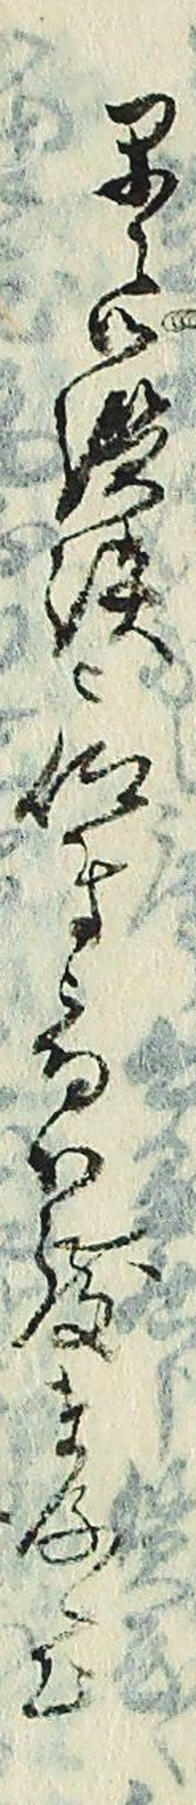早々御讃談被仰付被為下度奉存候以上
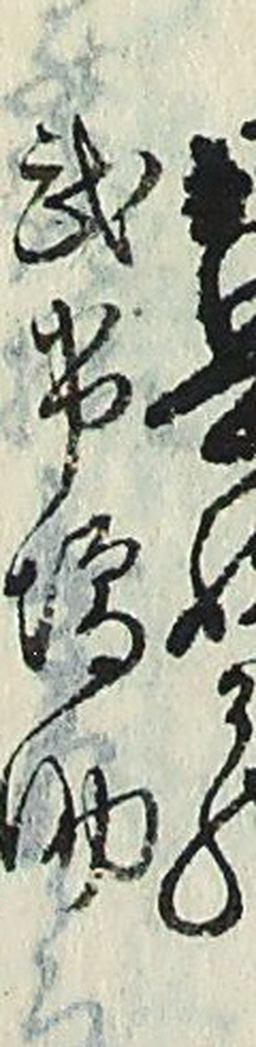武市増助
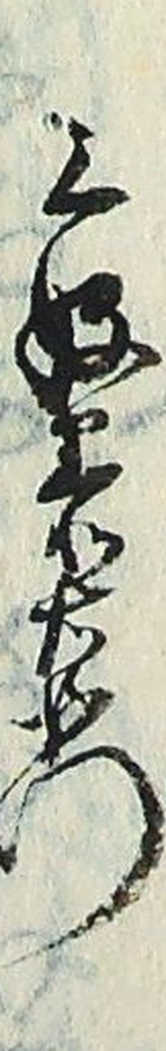三好泰右衛門
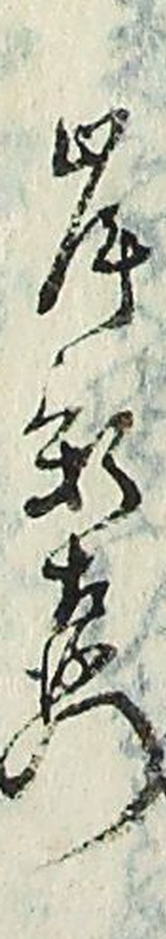岸新右衛門
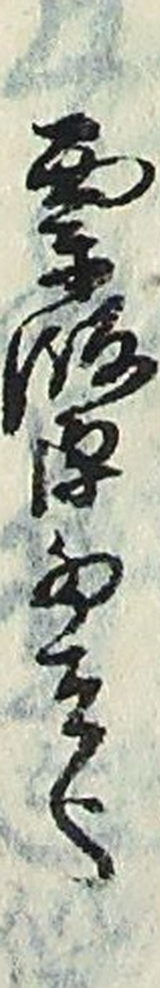粟飯原卯太郎
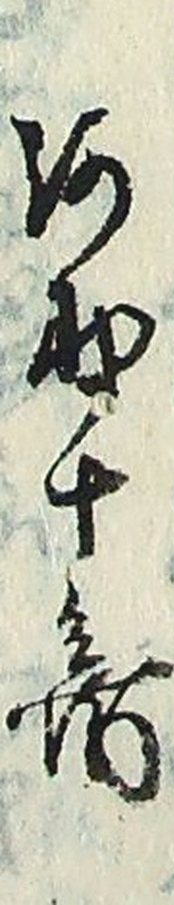河野十兵衛
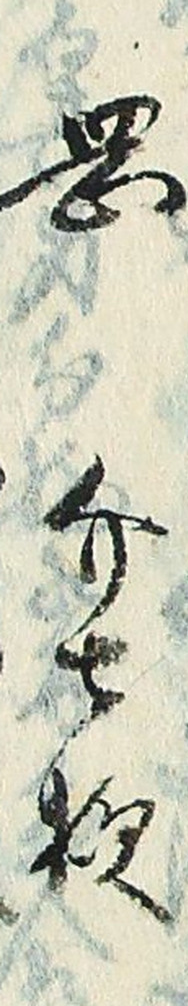岡介七様
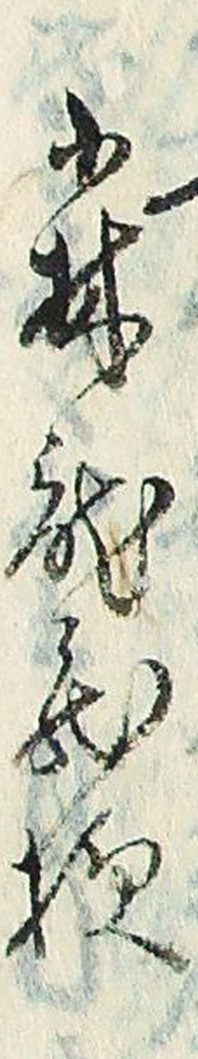小林龍蔵様

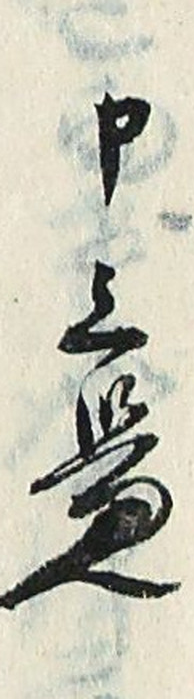申上覺
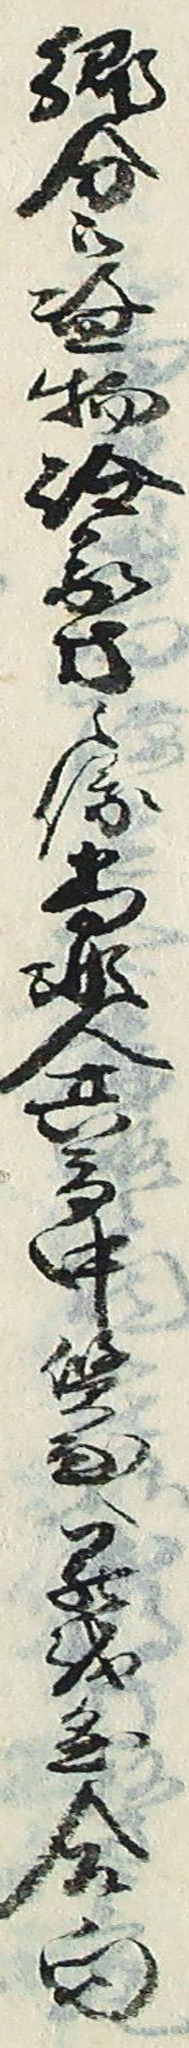郷分被盗物詮義方之儀番非人共市中質屋へ罷越懸合向
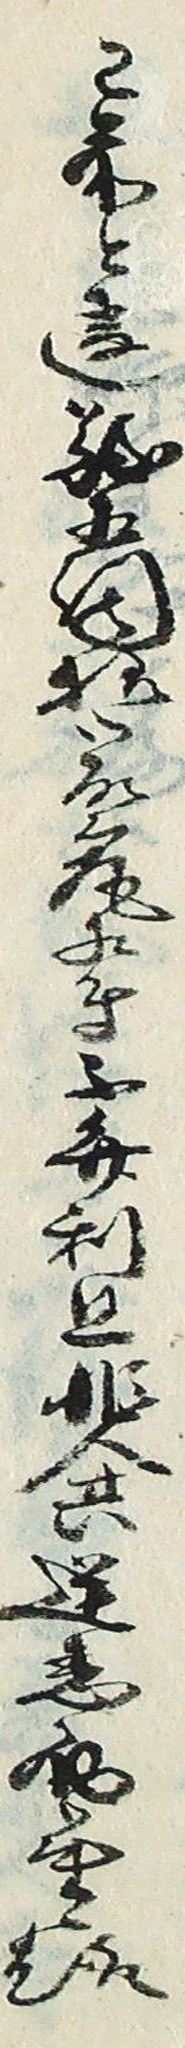已前と違難相調様御取究相付不弁利且非人共迷惑之助御坐候趣
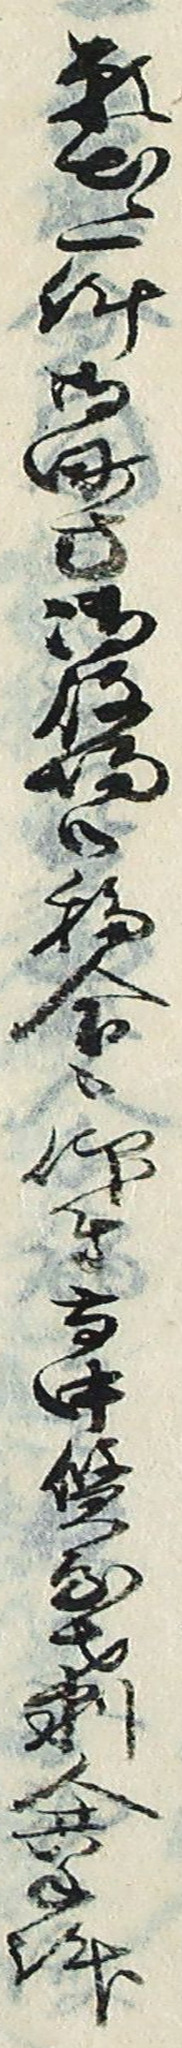願出候一件御町方御役場御移合被仰付市中質屋才判人共手許
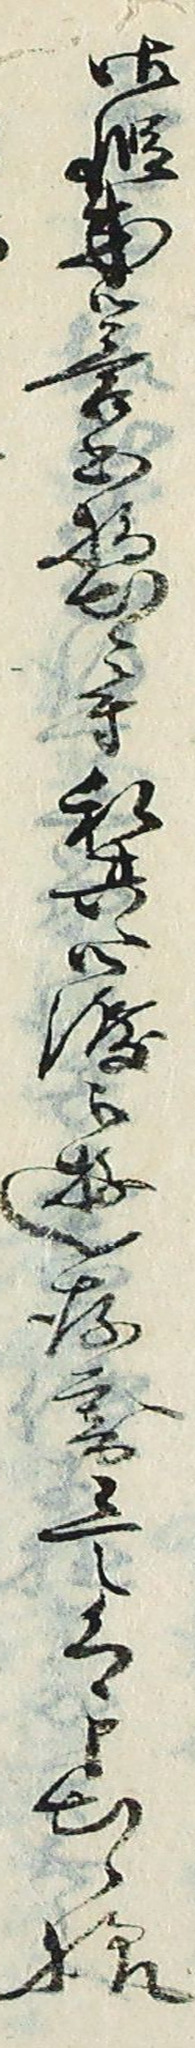御鍛来御答書指出候ニ付私共へ御渡被遊存寄有之候ハヽ申出候様
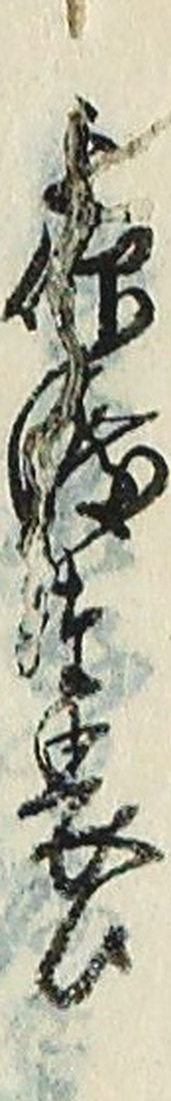被仰渡奉畏候
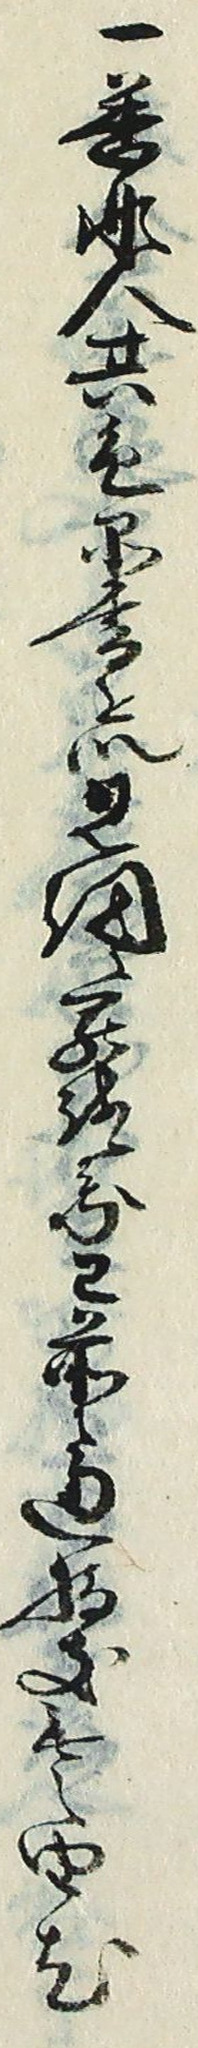一番非人共色品書を以て見調ニ罷越候義已前之通指支無之由尤
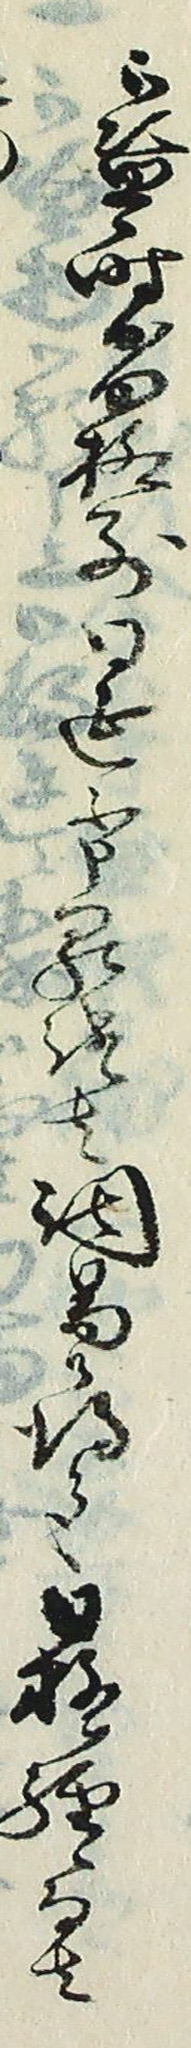被盗候時日ゟ格別日延不申罷越候者調易候得とも日数ヲ経候而者
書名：市郷質屋株御取究並御書出御趣法之写
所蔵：鳴門教育大学 Naruto University of Education
